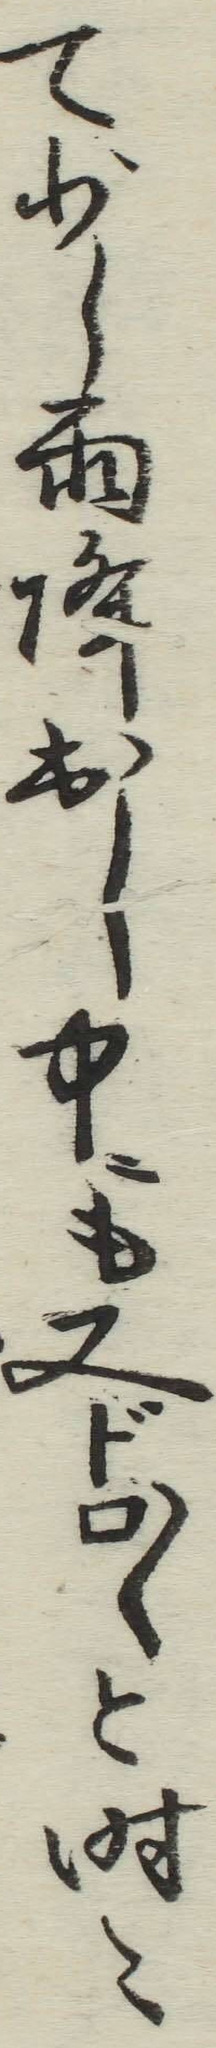て少し雨降出し中にもまたドロ〳〵と時々
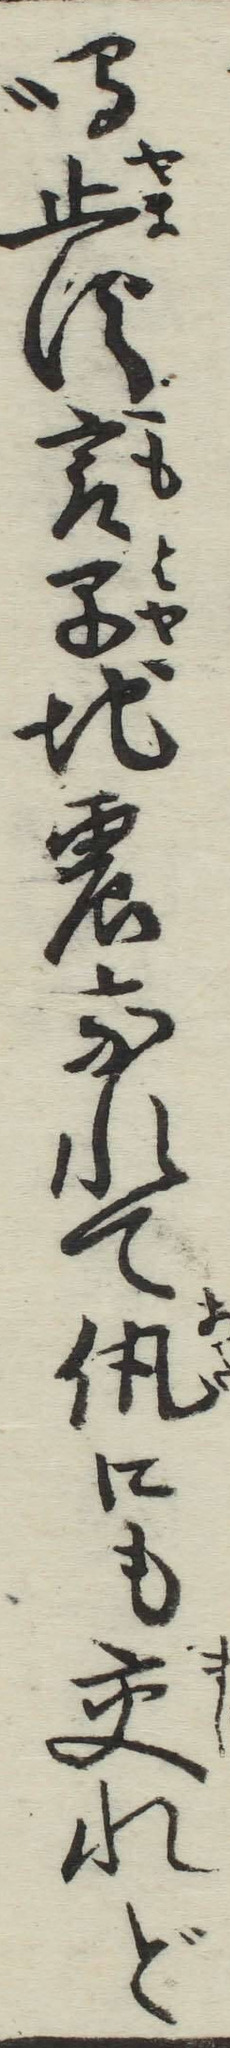鳴止まず最早地震なれて仇にも交れど
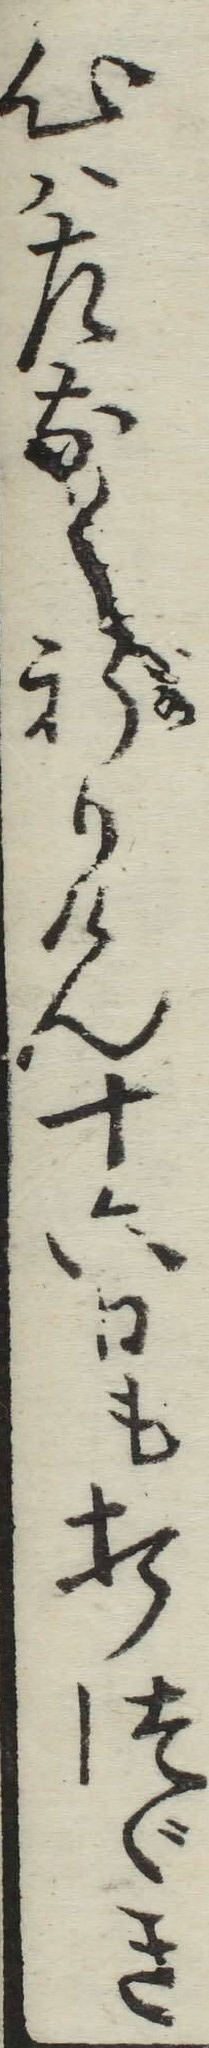心は左なく祈りけん十六日も打つゞき
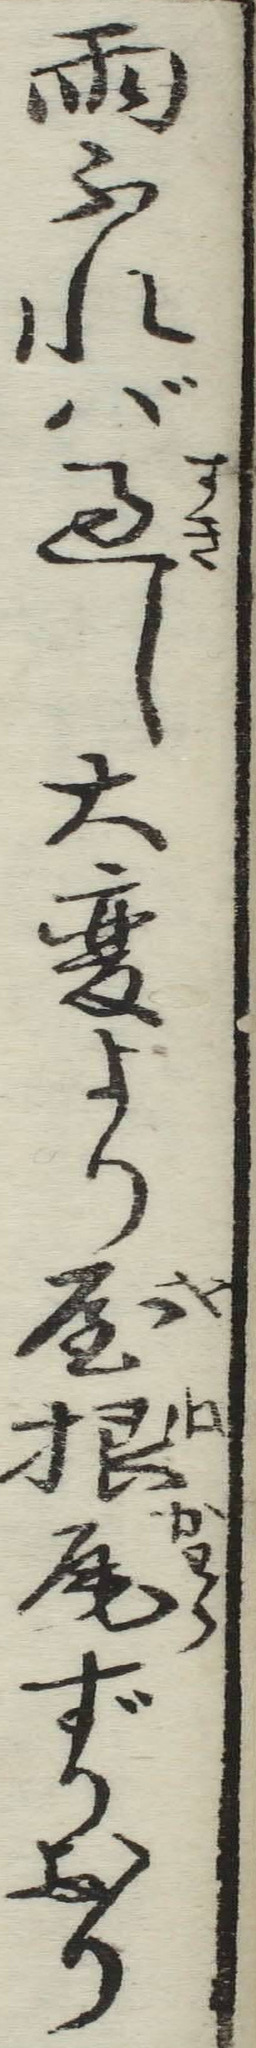雨ふれば過し大変より屋根瓦ずりおり
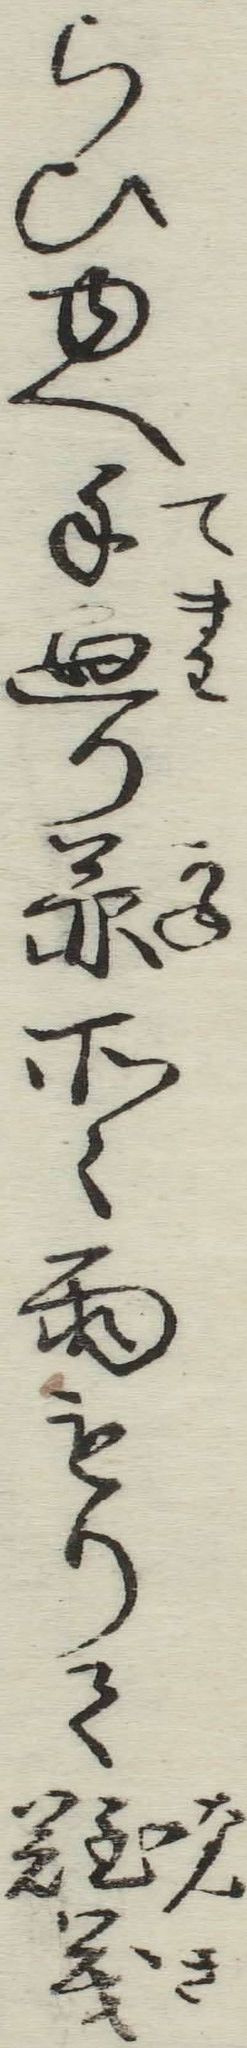らひゆへ手廻り兼所々雨もりて難義
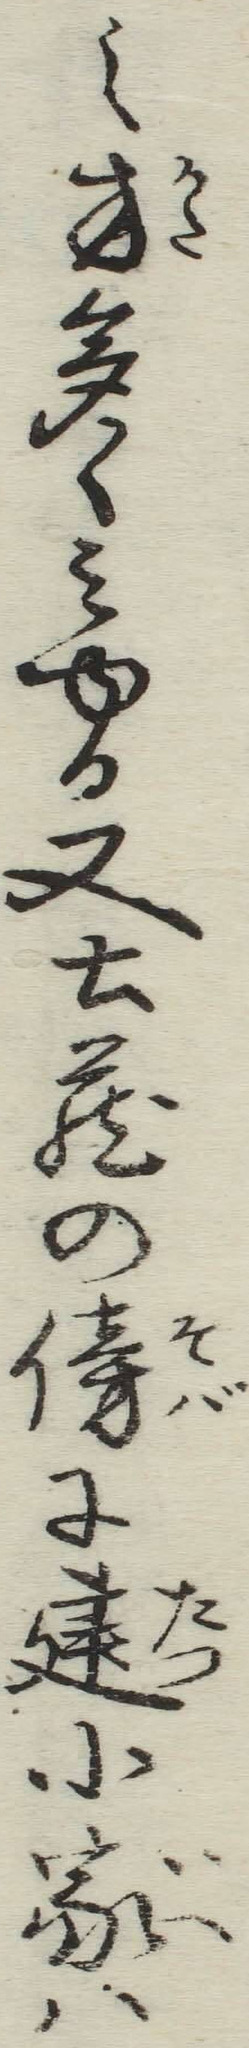之方多くみゆる又土蔵の傍に建小家は
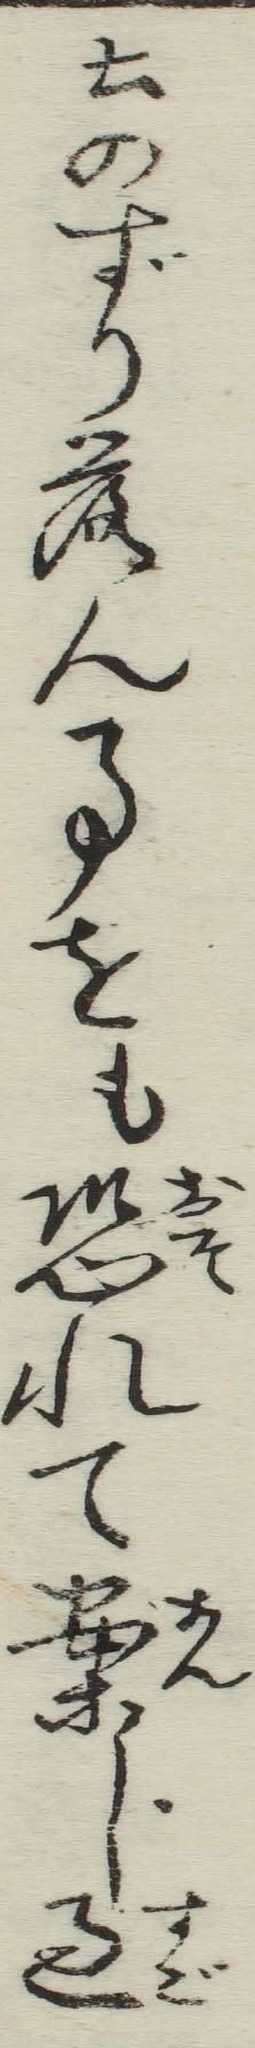土のずり落ん事をも恐れて案じ過
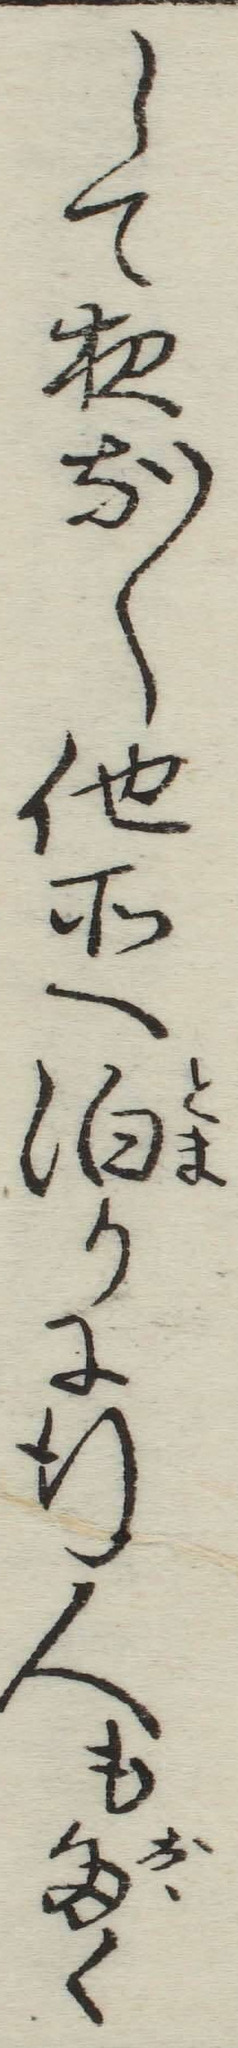して夜な〳〵他所へ泊りに行人も多く
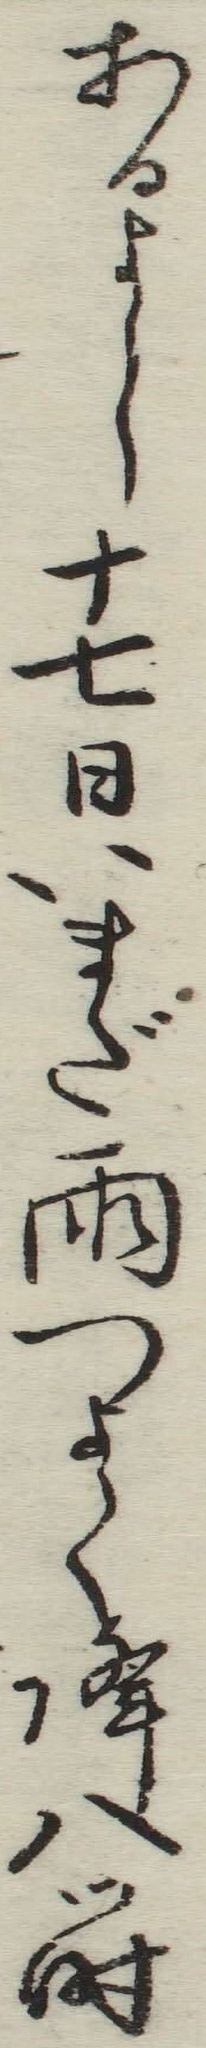あるよし十七日いまだ雨つよく降八ツ時
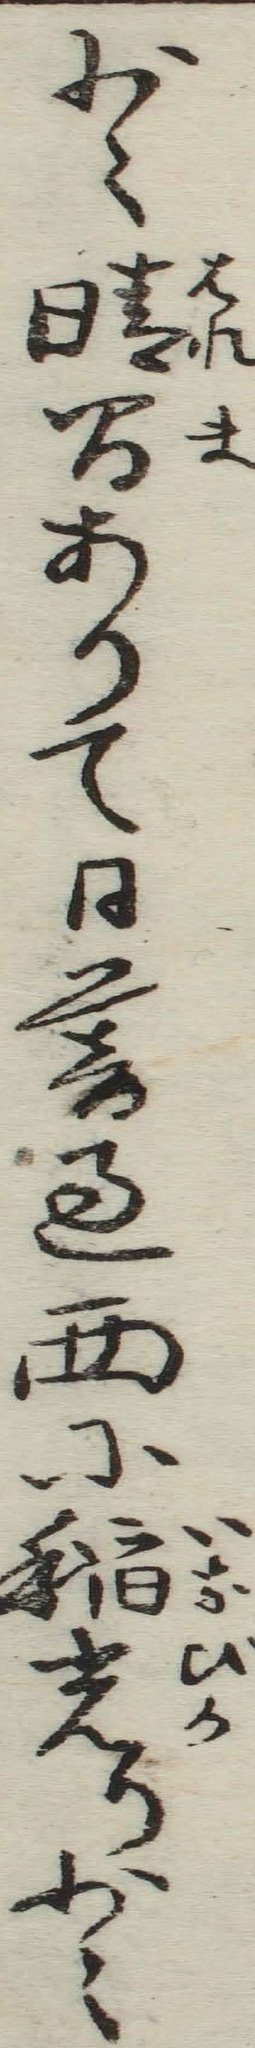少々晴間ありて日暮過西に稲光り少々

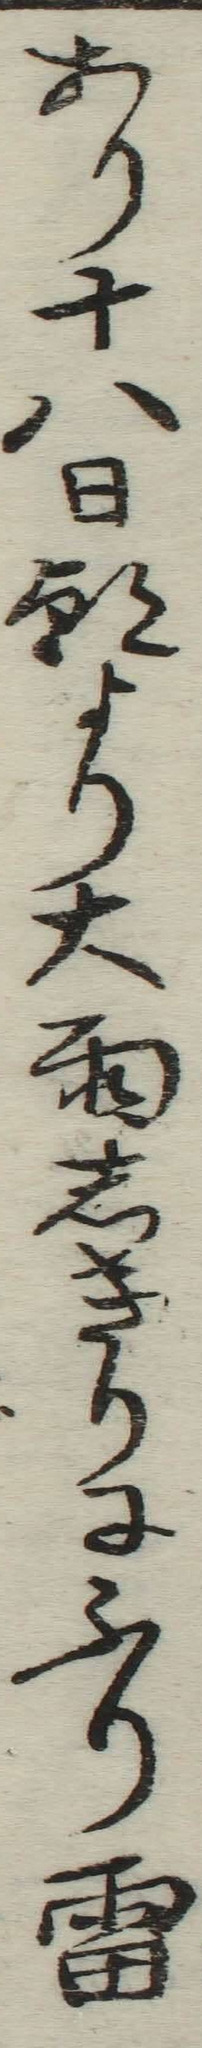あり十八日朝より大雨しきりにふり雷
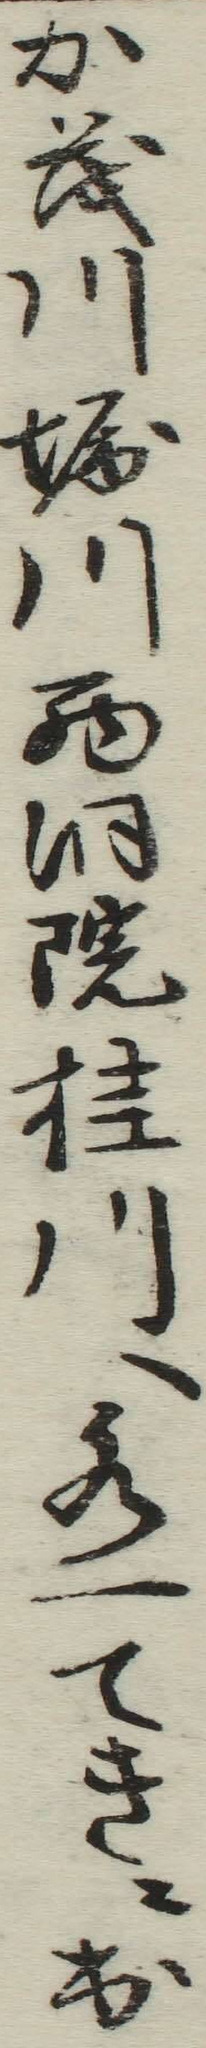加茂川堀川桂川西洞院桂川へ水一てきに出
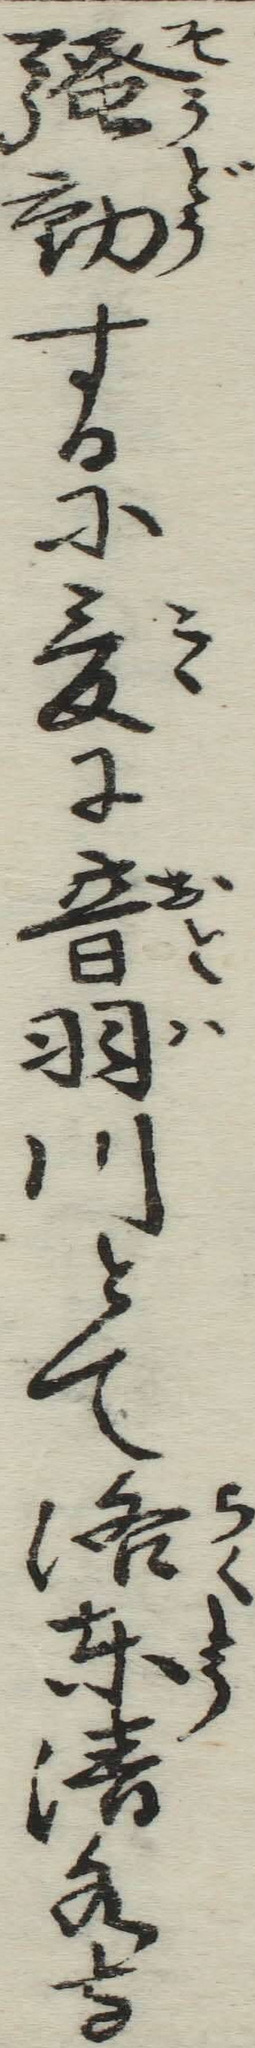騒動するに爰に音羽川とて洛東清水寺
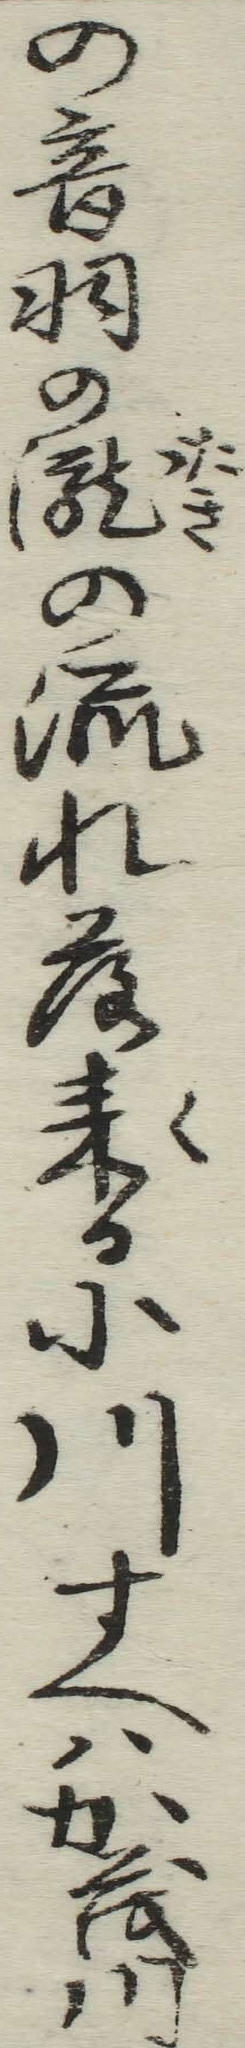の音羽の瀧の流れ落来る小川すへは加茂川
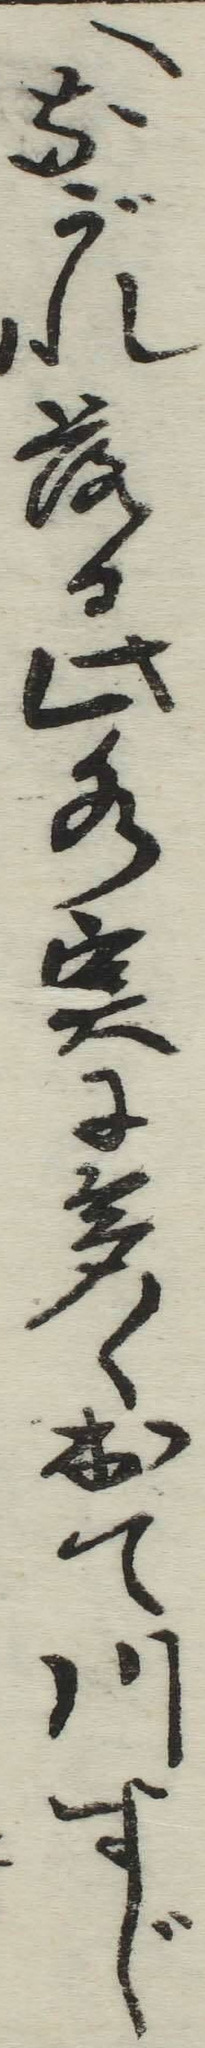へながれ落る此水実に多く出て川すじ
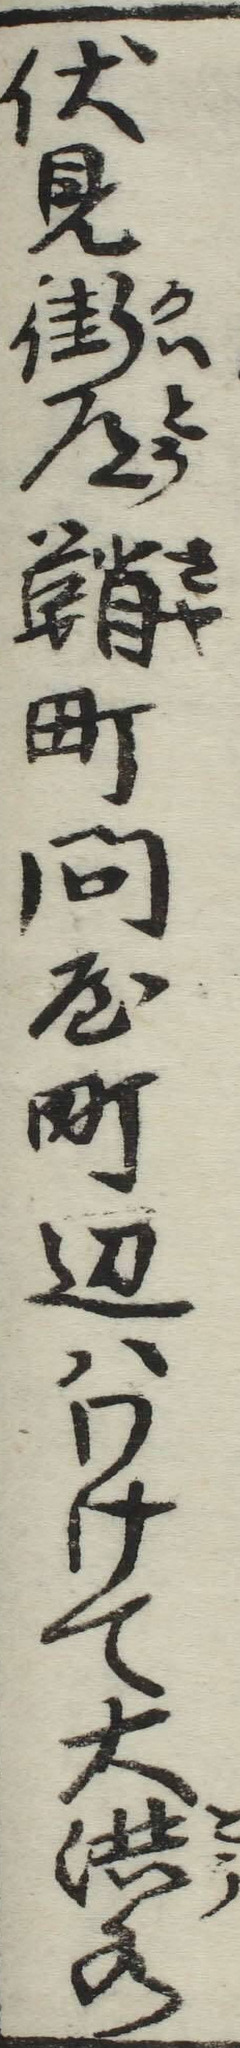伏見街道鞘町問屋町辺はわけて大洪水
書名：地震奇談／平安万歳楽
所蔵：国文学研究資料館
